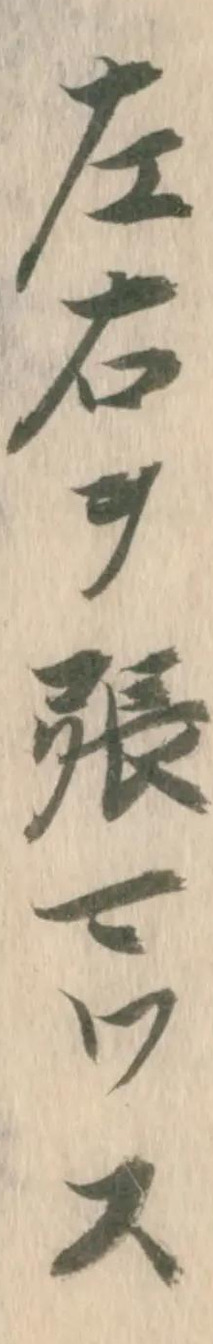左右ヲ張マワス
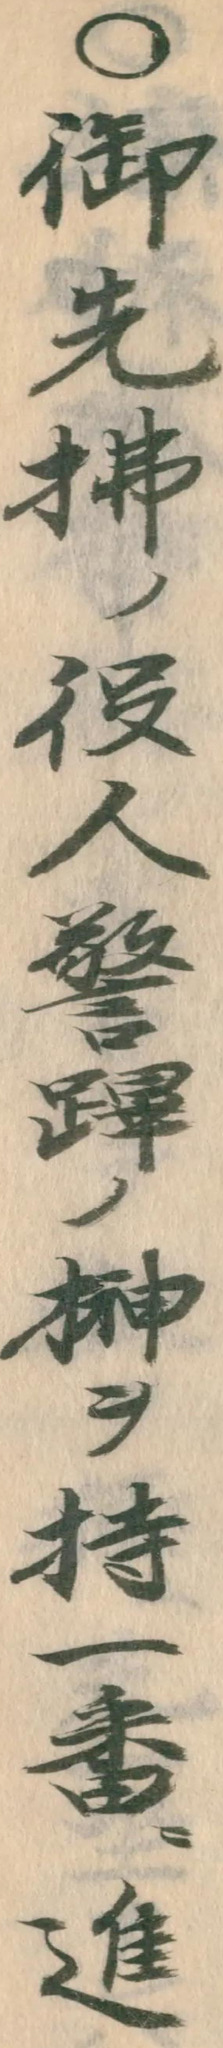○御先払ノ役人ノ警蹕ノ榊ヲ持一番ニ進
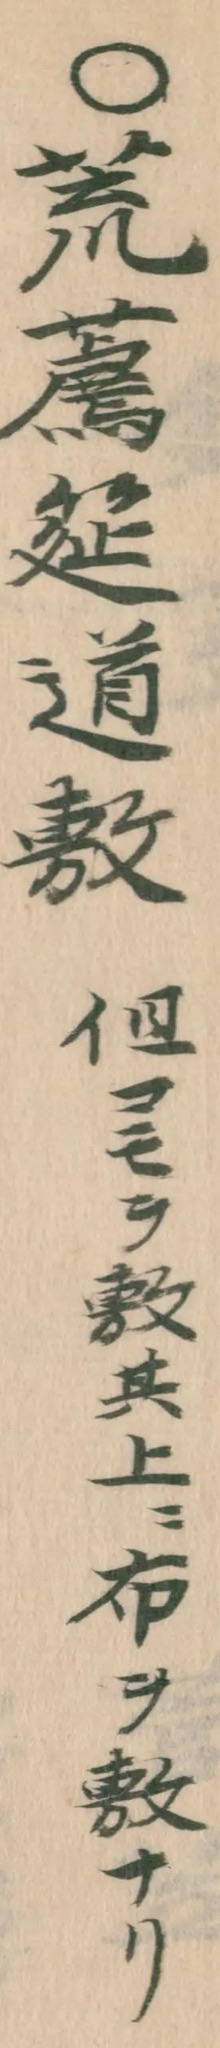○荒薦筵道敷但コモヲ敷其上ニ布ヲ敷ナリ

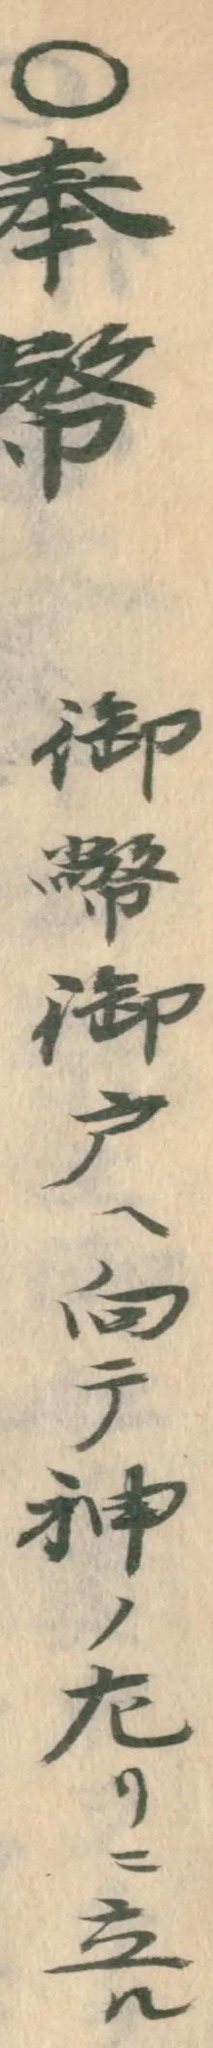○奉幣御幣御戸へ向テ神ノ左リニ立ル
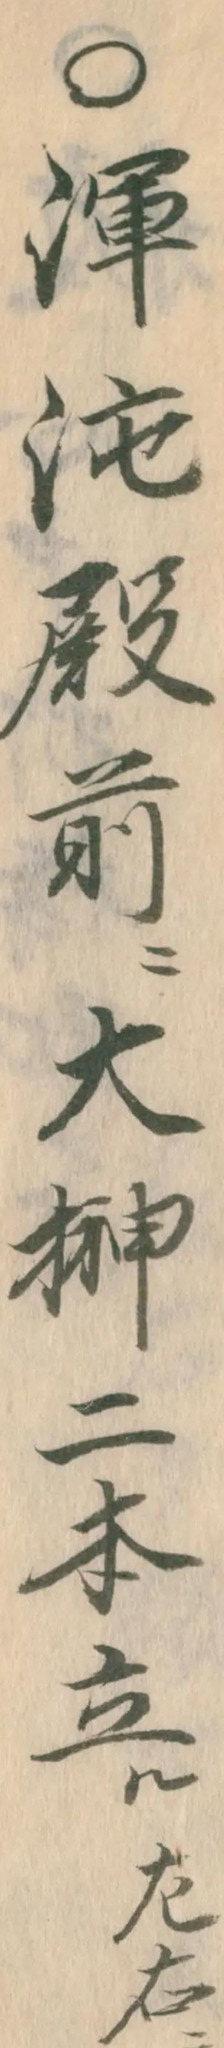○渾殿前ニ大榊二本立ル左右ニ
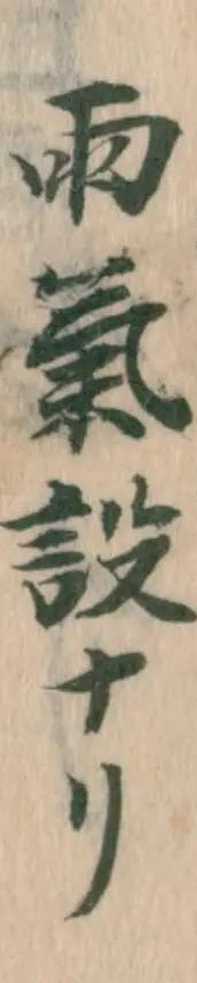雨気設ナリ
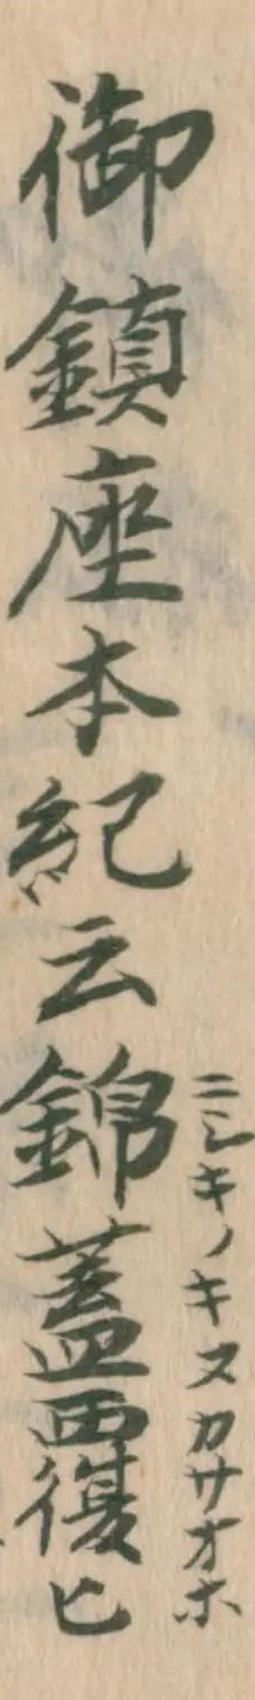御鎮座本紀云錦蓋覆ヒ
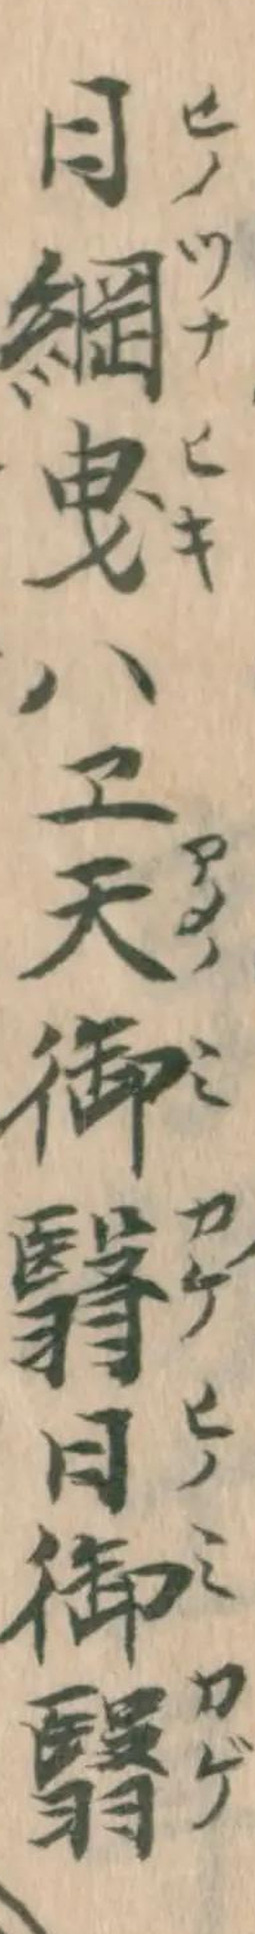日綱曳ハヱ天御翳日御翳
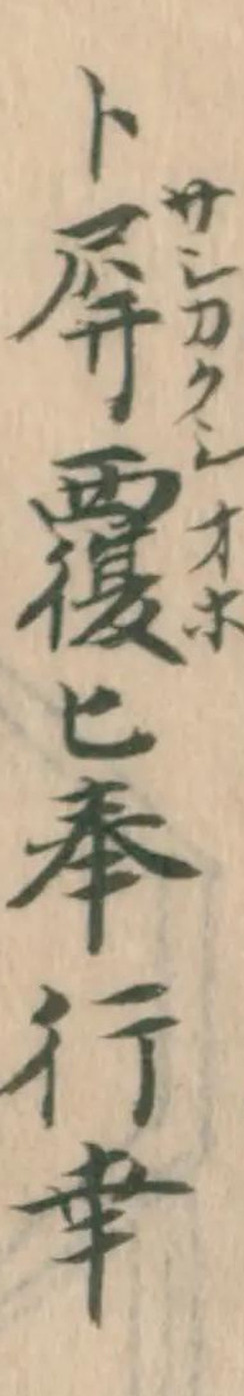ト屏覆ヒ奉行幸
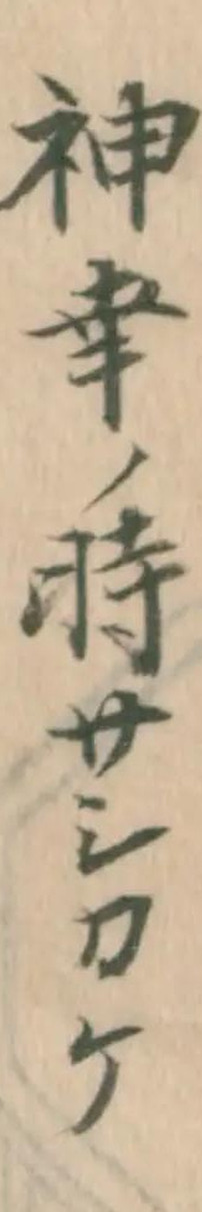神幸ノ時サシカケ
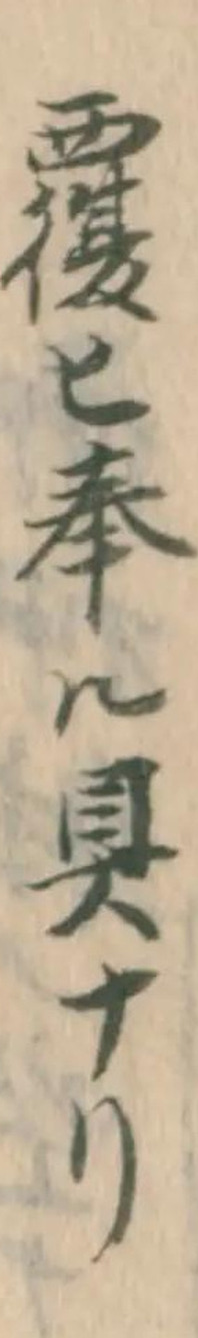覆ヒ奉ル具ナリ

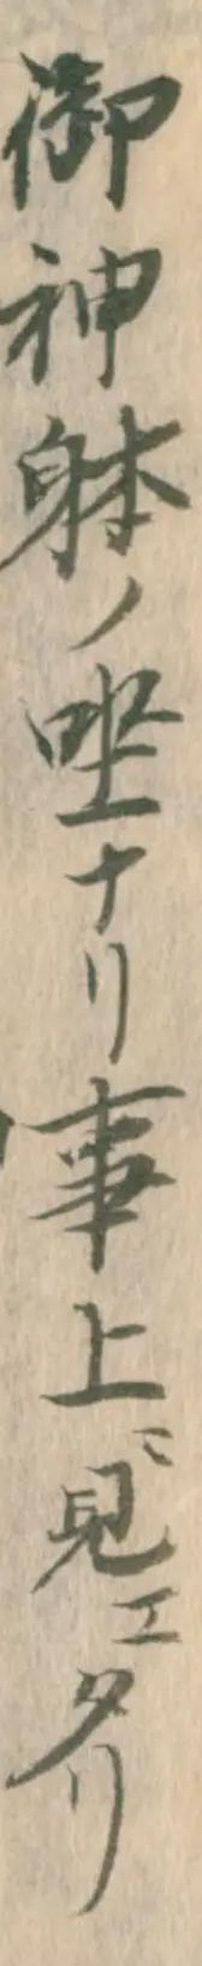御神体ノ坐ナリ事上ニ見エタリ
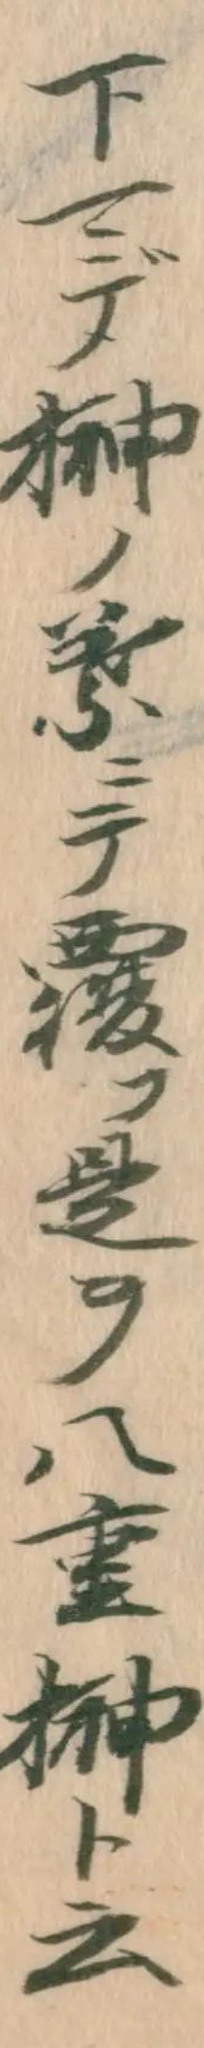下マデ榊ノ葉ニテ覆フ是ヲ八重榊ト云
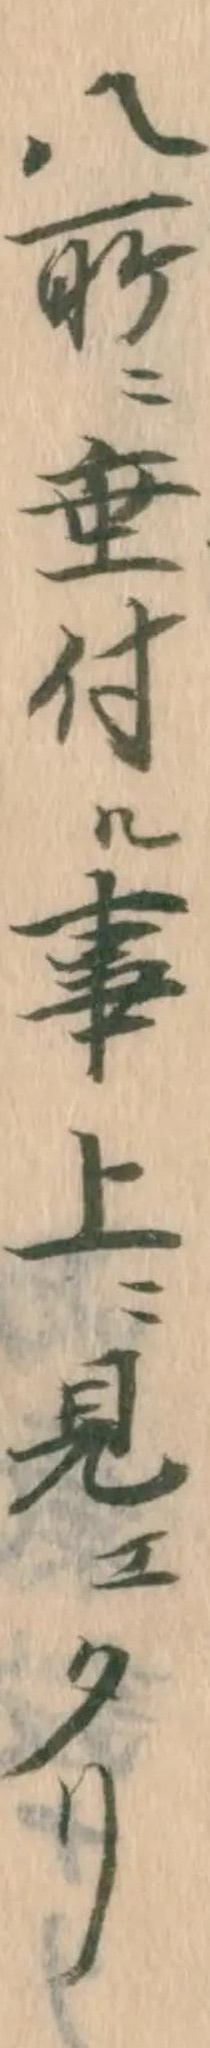八所ニ垂付ル事上ニ見エタリ
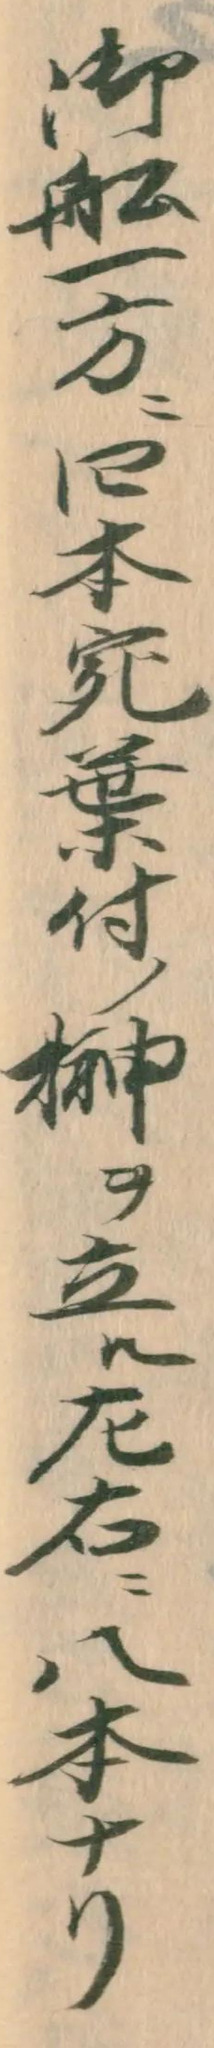御船一方ニ四本宛葉付ノ榊ヲ立ル左右ニ八本ナリ
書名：賀茂社記録. 第91冊
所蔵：国立国会図書館 National Diet Library, JAPAN
